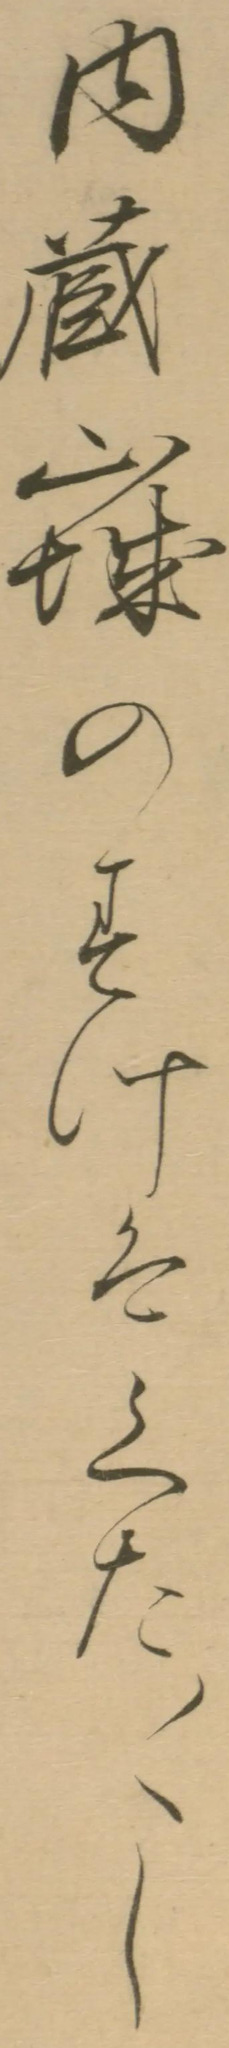内蔵山城のすけはくた〳〵し
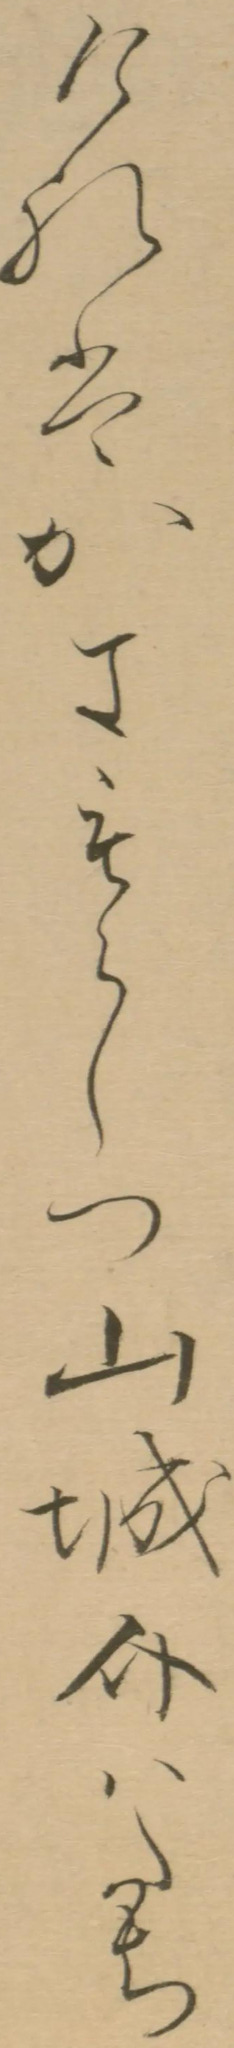けれはかきもらしつ山城介はたち
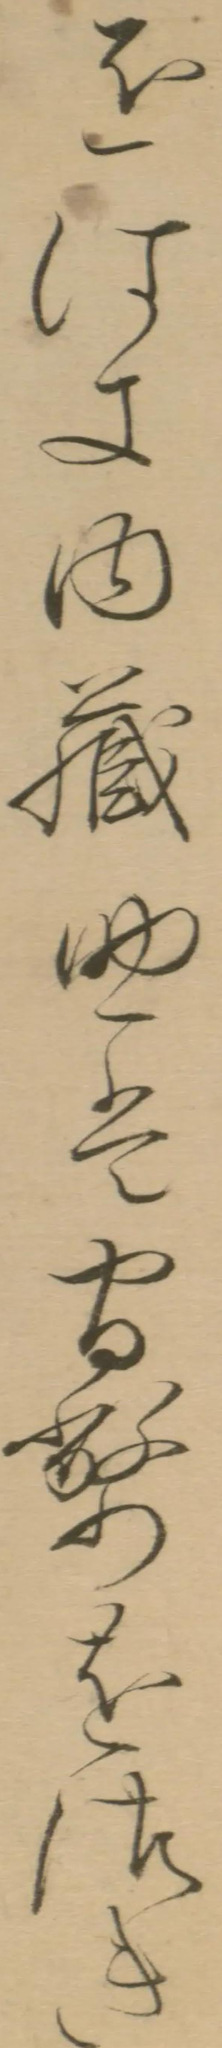をはき内蔵助は官幣をさき
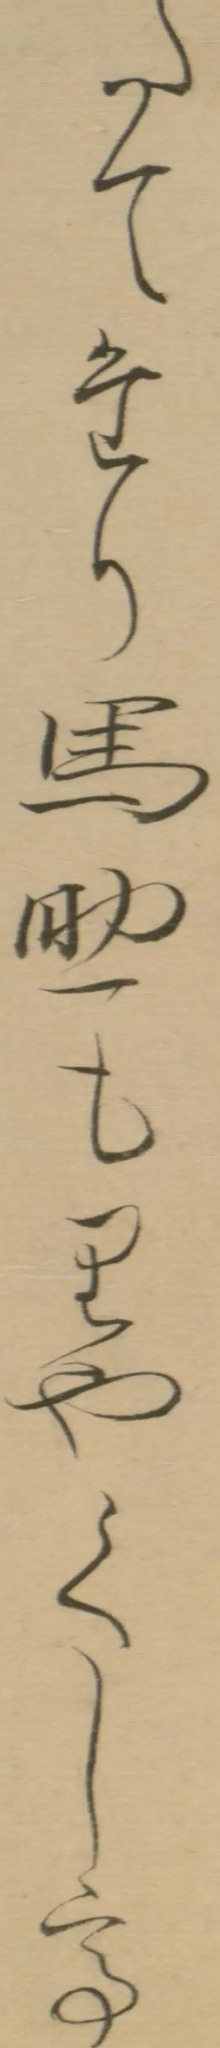たてたり馬助もりやくして

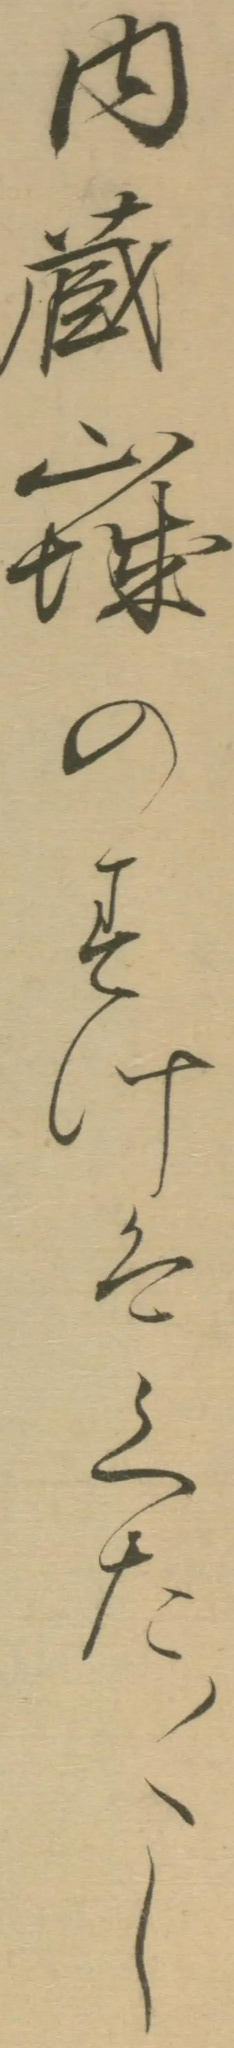内蔵山城のすけはくた〳〵し
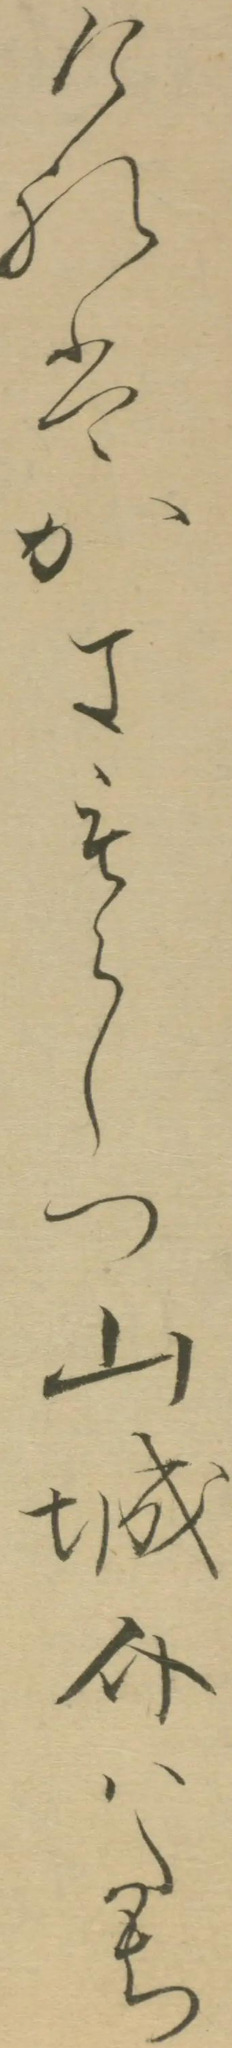けれはかきもらしつ山城介はたち
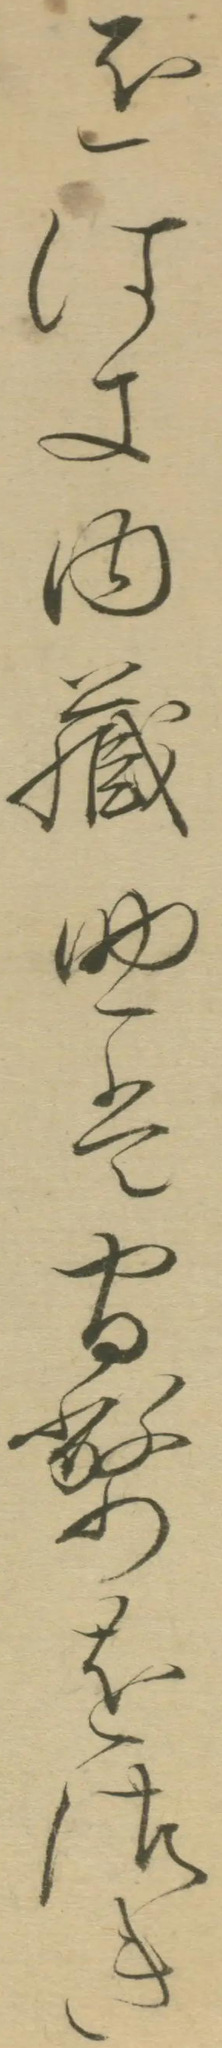をはき内蔵助は官幣をさき
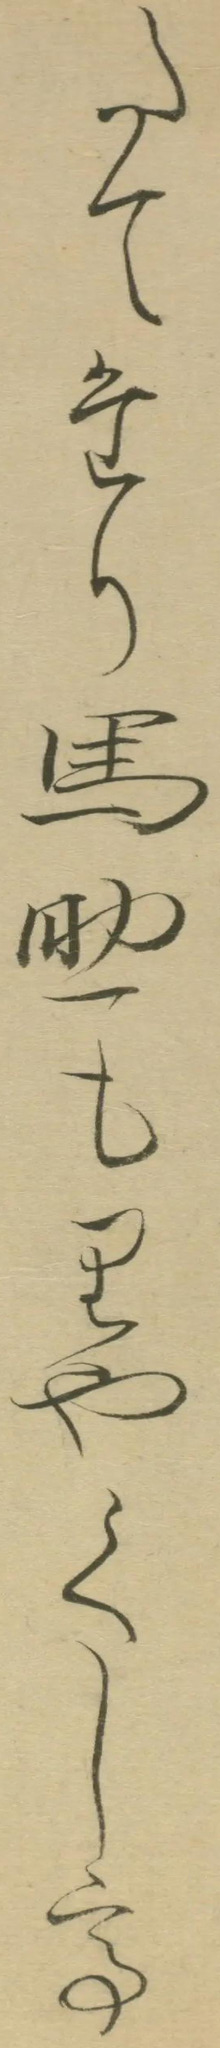たてたり馬助もりやくして
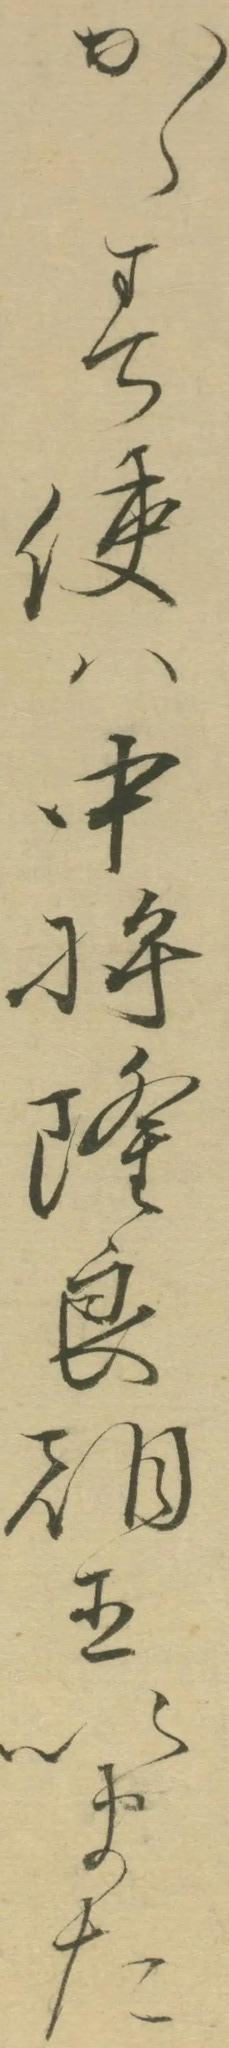かゝす使は中将隆良朝臣いまた
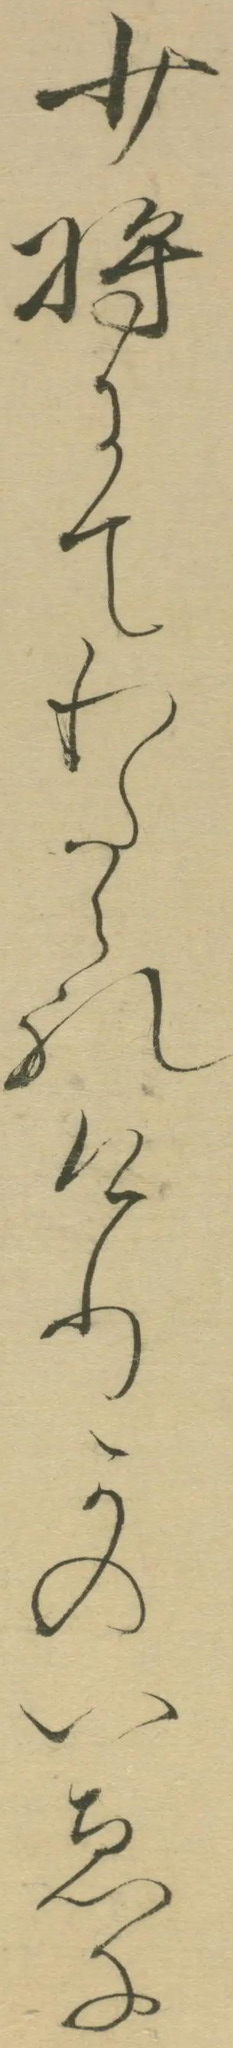少将にてわたられけりかのいゑに
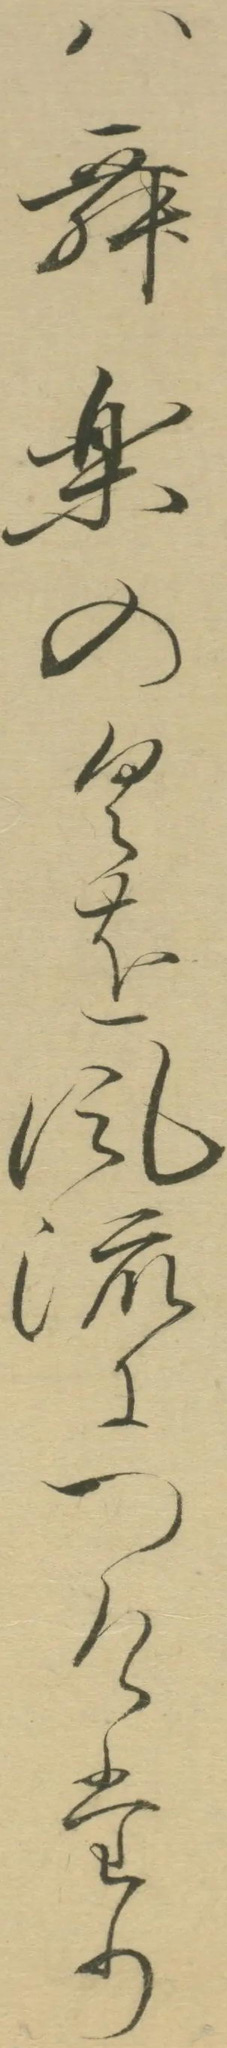は舞楽の具を風流につけたり
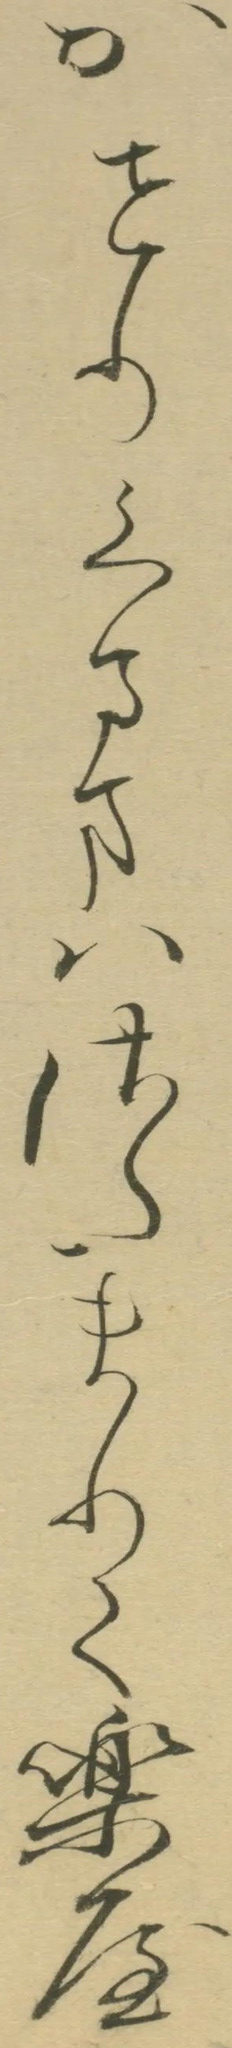かさりくるまはさたまりて楽屋
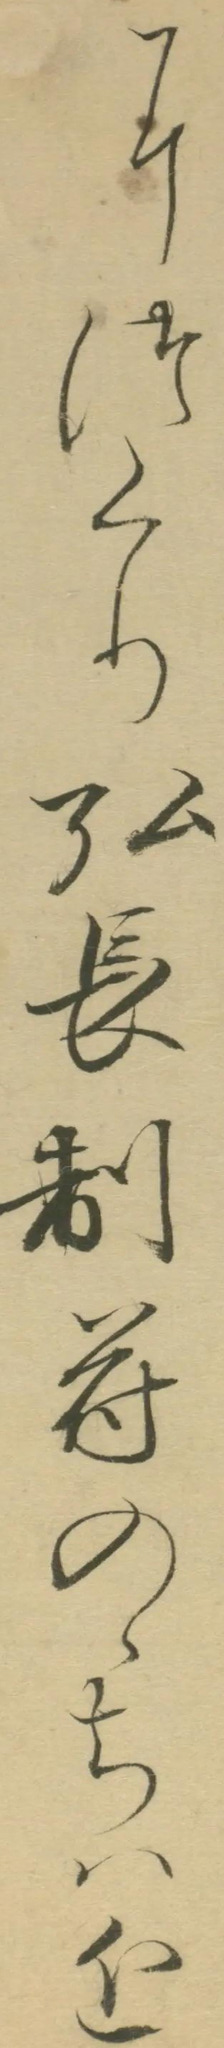につくり弘長制符のゝちは近
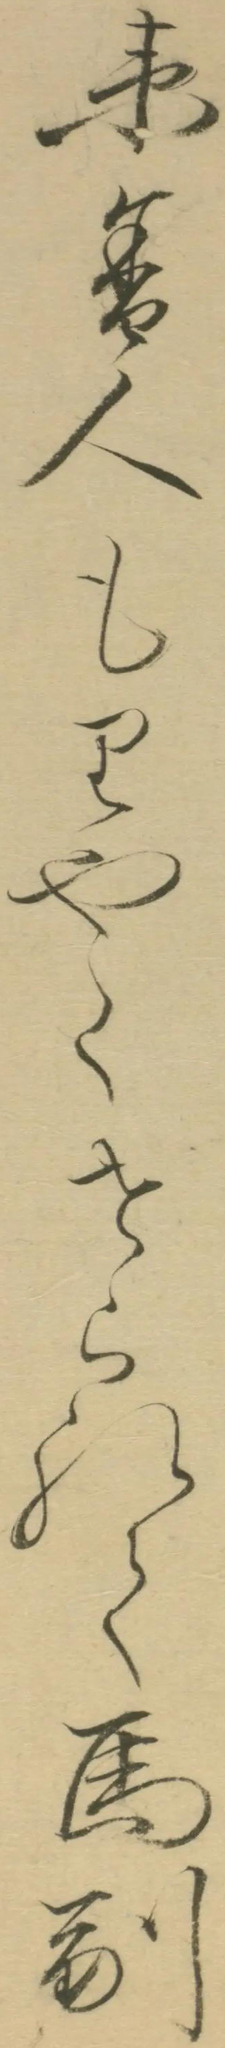衛舎人もりやくせられて馬副
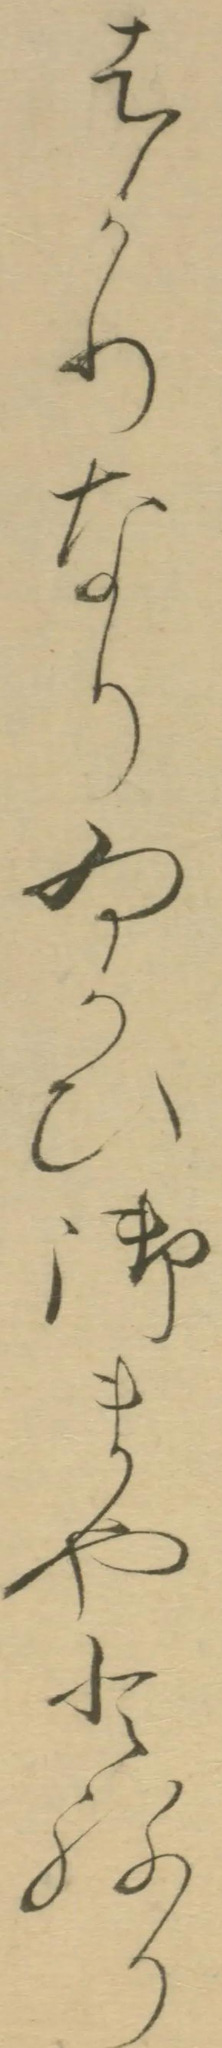はかりなりゐかひ御まやとねり
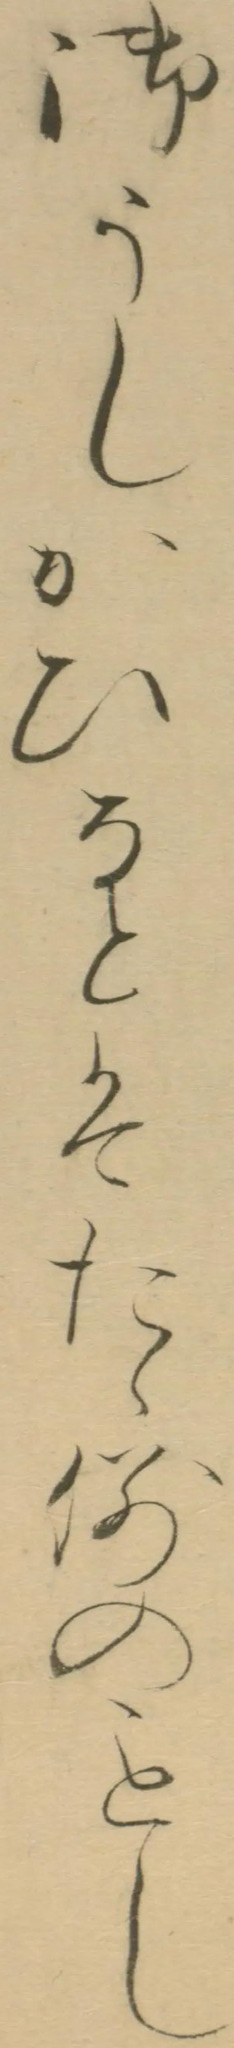御うしかひなとはたゝ例のことし
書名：文永賀茂祭図. [2]
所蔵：国立国会図書館 National Diet Library, JAPAN
